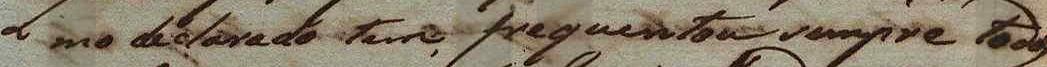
mo declarado tem, frequentou sempre todos
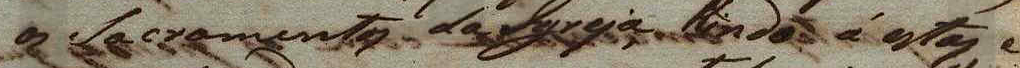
os Sacramentos da Igreja, hindo á estas e
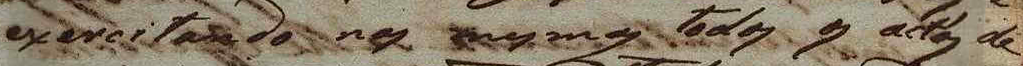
exercitando nas mesmas todos os actos de
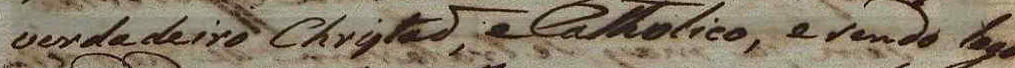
verdadeiro Christaõ, e Catholico, e sendo logo
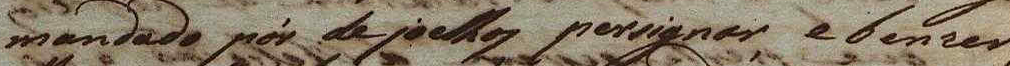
mandado pór de joelhos persignar, e benzer,
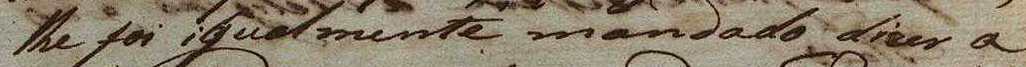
lhe foi igualmente mandado dizer a
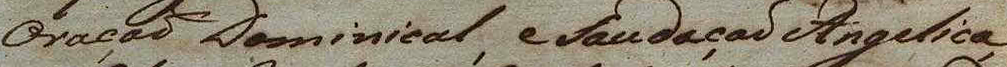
oraçaõ Dominical, e Saudaçaõ Angelica,
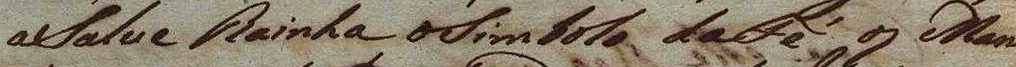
a Salue Rainha, o Simbolo da Fé os Man
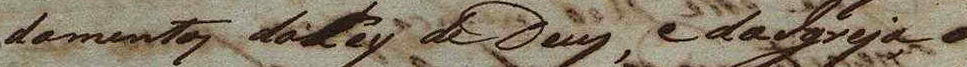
damentos da Ley de Deus, e da Igreja o
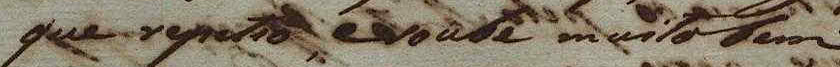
que repetio, e soube muito bem.
